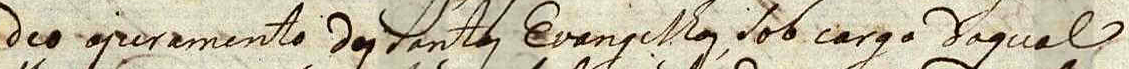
deo juramento dos santos Evangelhos sob cargo do qual
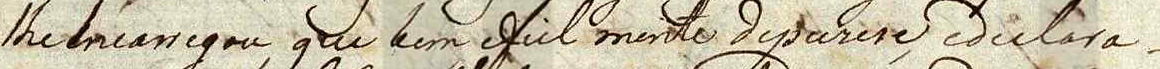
lhe encarregou, que bem e fielmente depuzese, e declara
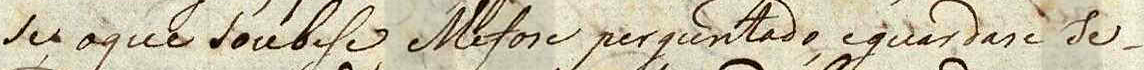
se o que soubese e lhe fose perguntado e guardar se
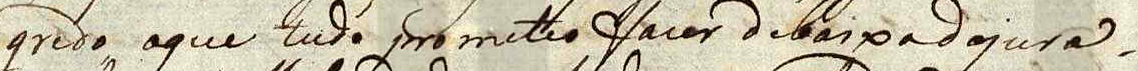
gredo o que tudo prometeo fazer debaixo do jura
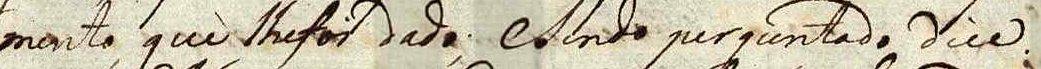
mento que lhe foi dado; e sendo perguntado dice.
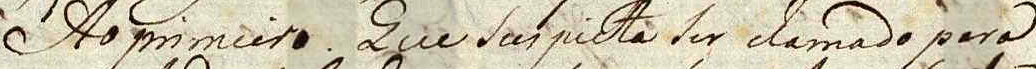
Ao primeiro. Que suspicta ser chamado para
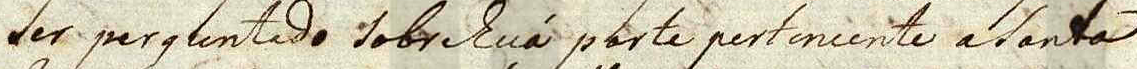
ser perguntado sobre huā parte pertencente a Santa
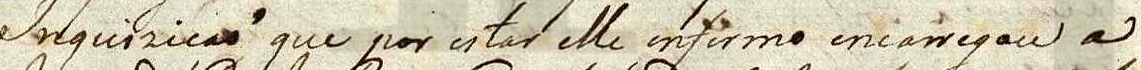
Inquiziçaõ que por estar elle enfermo encarregou a
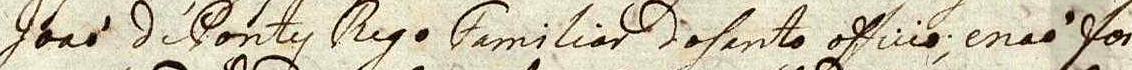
Joaõ de Pontes Rego Familiar do santo officio; e naõ foi
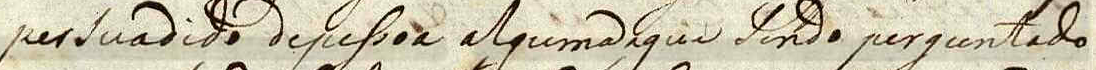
persuadido de pessoa alguma que sendo perguntado
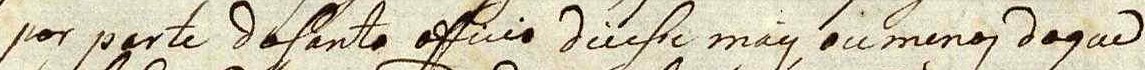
por parte do santo officio dicesse mais ou menos do que
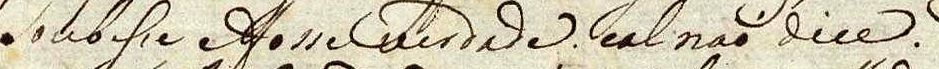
soubesse e fosse verdade e al naõ dice.
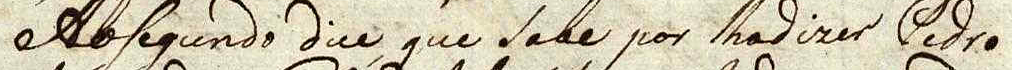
Ao segundo dice que sabe por lho dizer Pedro
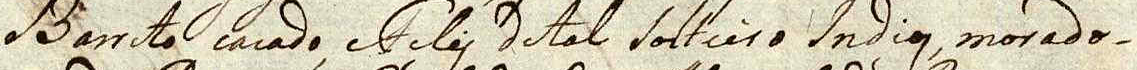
Barreto cazado e Felis de tal solteiro Indios, morado
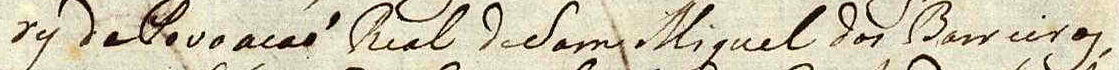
res da Povoaçaõ Real de Sam Miguel dos Barreiros,
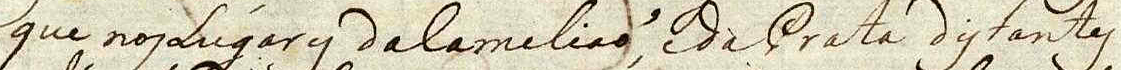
que nos Lugares do Cameliaõ, e da Prata distantes
